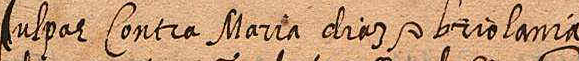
Culpas Contra Maria diaz e briolania
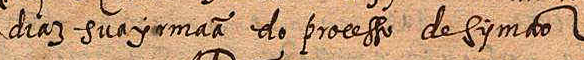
diaz sua yrmaã do processo de symaõ
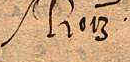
/ Roīz /
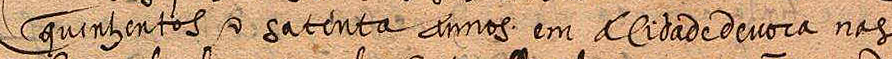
quinhentos e satenta annos em a Cidade deuora nas
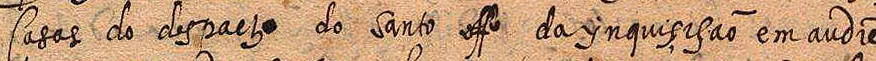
Casas do despacho do Santo offo da ynquisisaõ em audi̅e
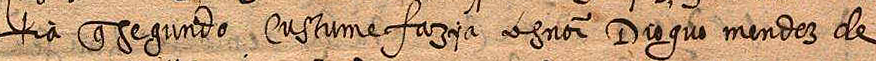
tia q̅ segundo custume fazya o sno̅r Dioguo mendez de
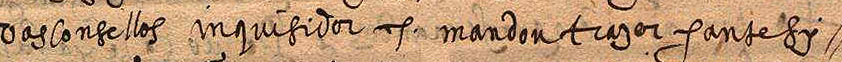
vasconsellos inquisidor cꝭ mandou trazer ꝑante sy //
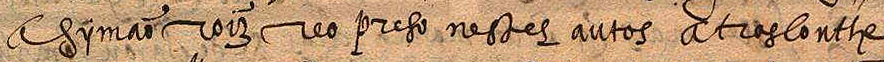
a symaõ roi̅z reo preso nestes autos atras conthe
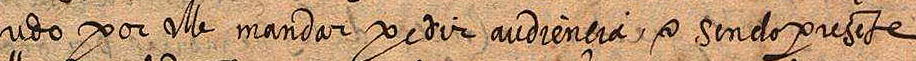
udo por elle mandar pedir audiençia, e sendo pres̅ete
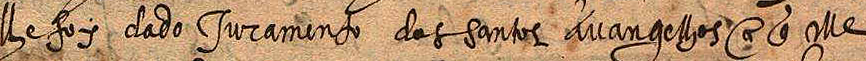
lhe foy dado Juramento dos santos auangelhos e q̅ elle
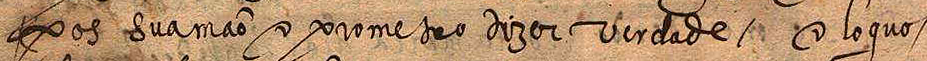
pos sua mão e prometeo dizer verdade / e loguo /
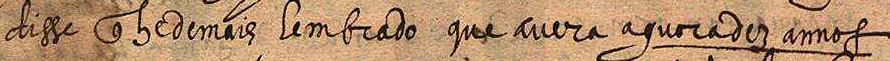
disse q̅ he demais lembrado que auera aguora dez annos
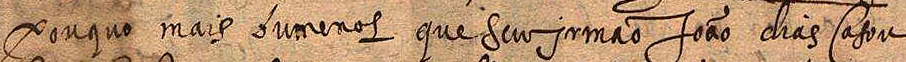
pouquo mais ou menos que seu jrmão João dias Casou
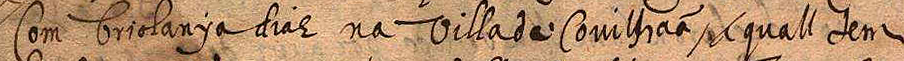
Com briolanya diaz na uilla da Couilhaã / a quall tem
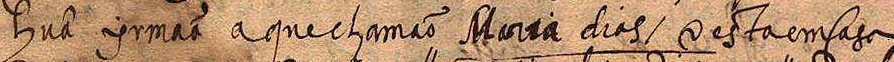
huã yrmaã a que chamão Maria dias / e esta em Casa
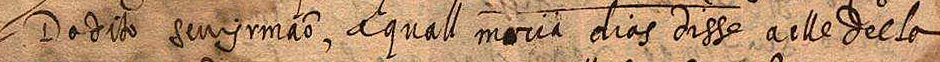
Do dito seu yrmão, a quall maria dias disse a elle decla
